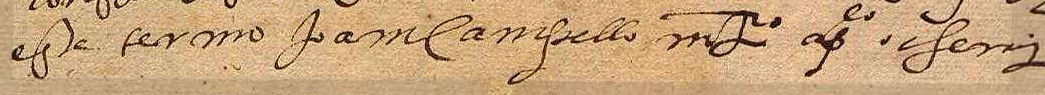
este termo Joam Campello notro apco o escruj
